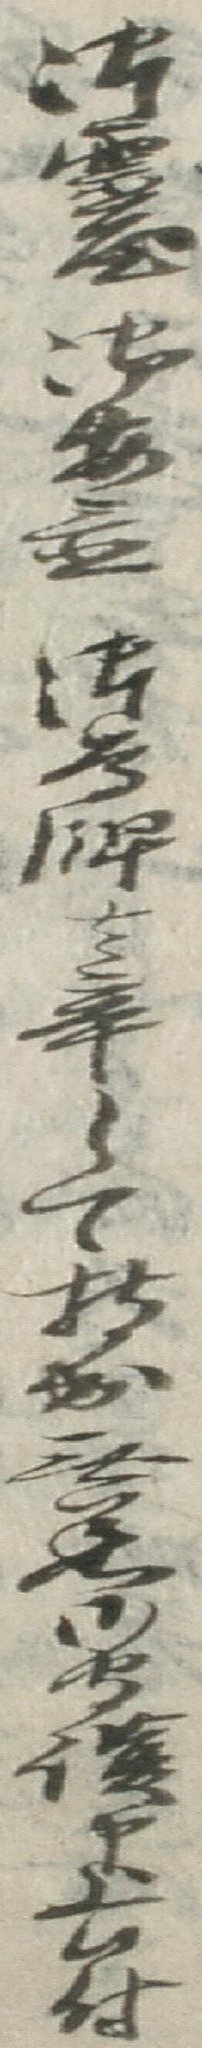御霊屋御安置御尊牌は辛して持出無恙御守護申上候付
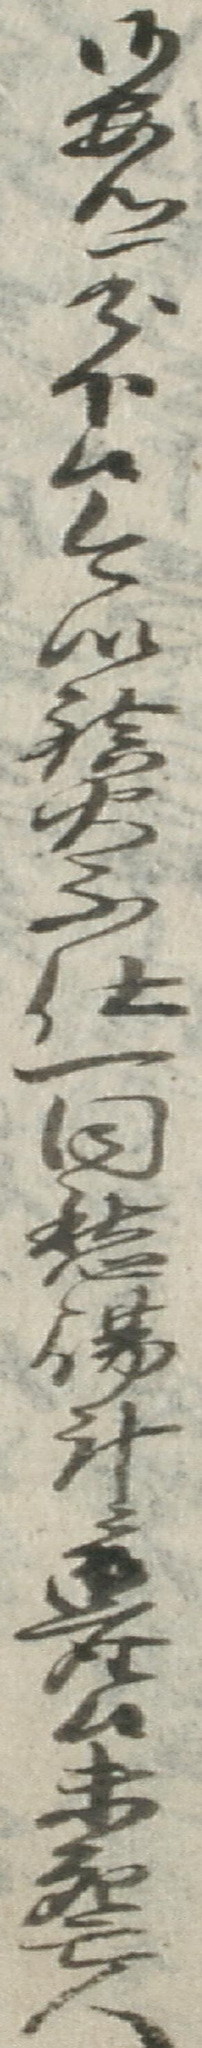御安心可被下候今以鎮火不仕一同愁傷計二御座候未死亡人
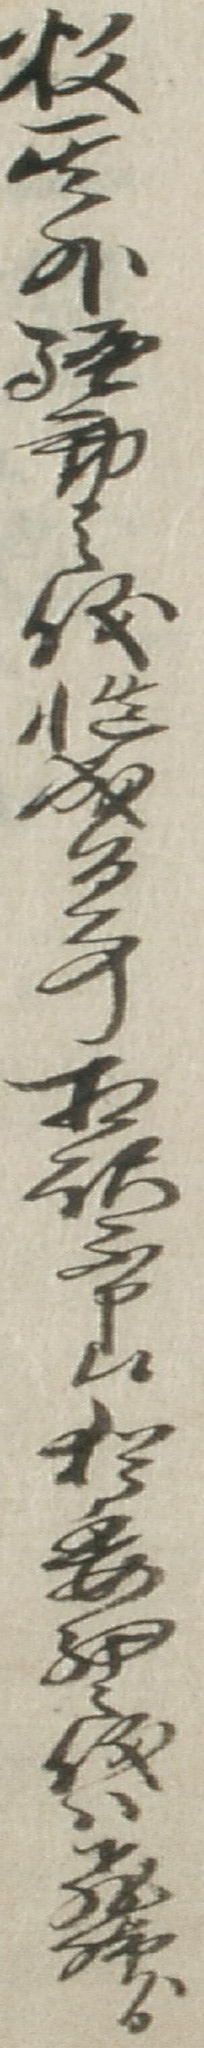数其外騒動之儀慥成る事相訳不申候猶委細之儀ハ飛脚ゟ
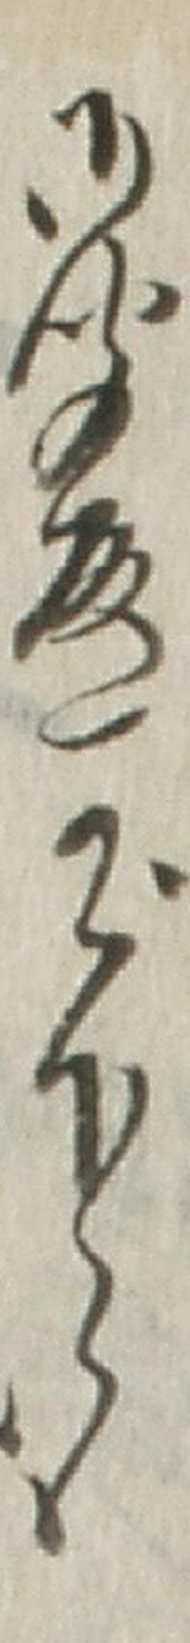御聞取可被下候以上
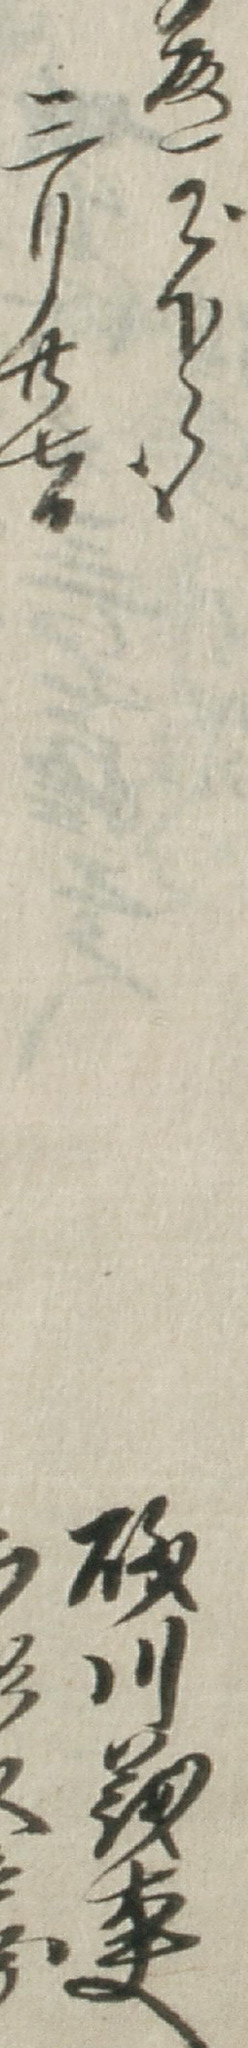三月廿七日砥川儀？太夫
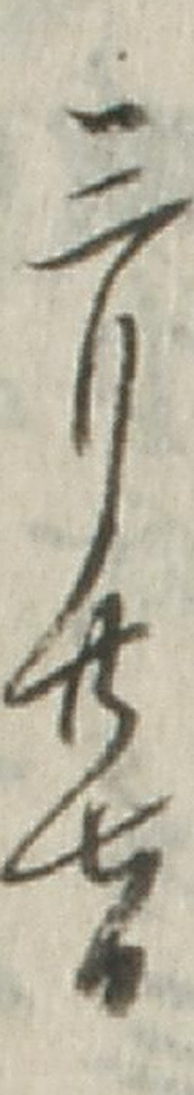三月廿七日
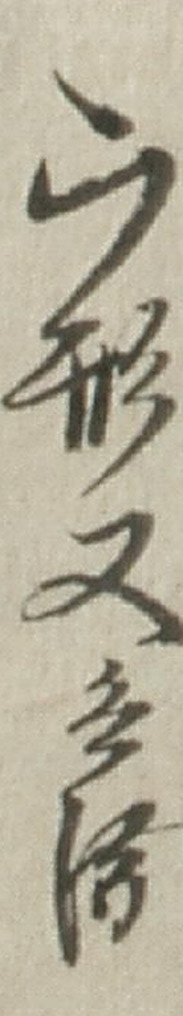山形又兵衛
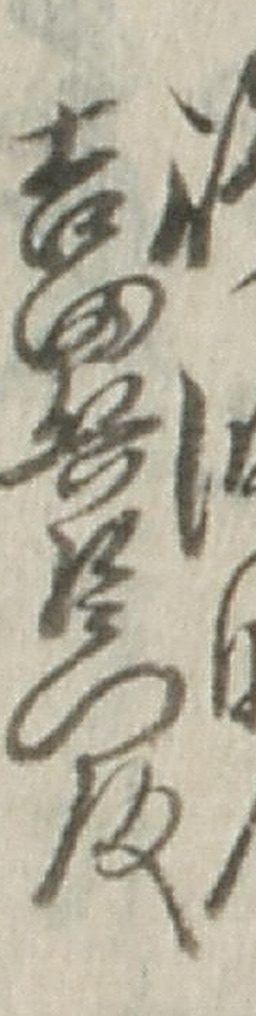吉田兵左衛門殿
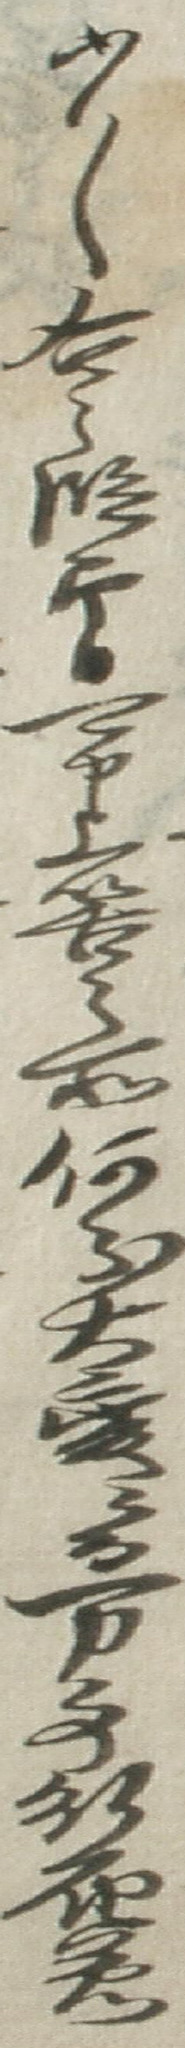尚〳〵右之段即日可申上筈之所何分大変二而万事行届兼
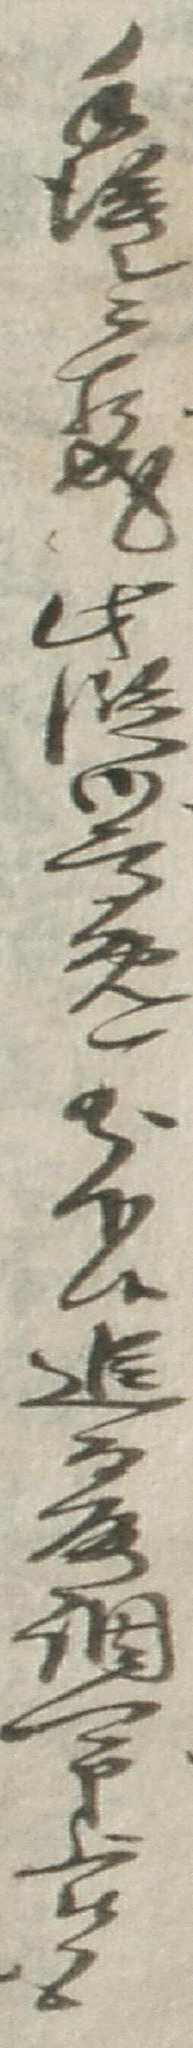手後ㇾ二相成候此段御高免可被下候追而取調可申上候以上
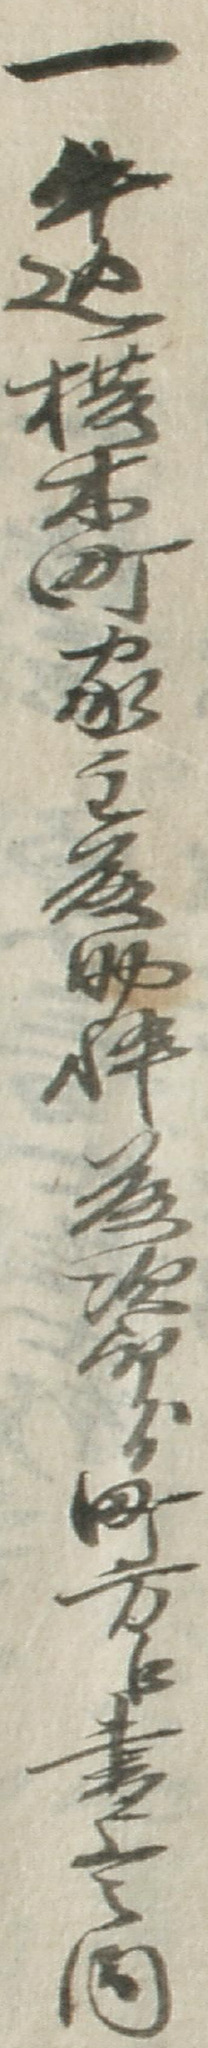一牛込榎木町家主藤助忰藤次郎ゟ町方江書上之内
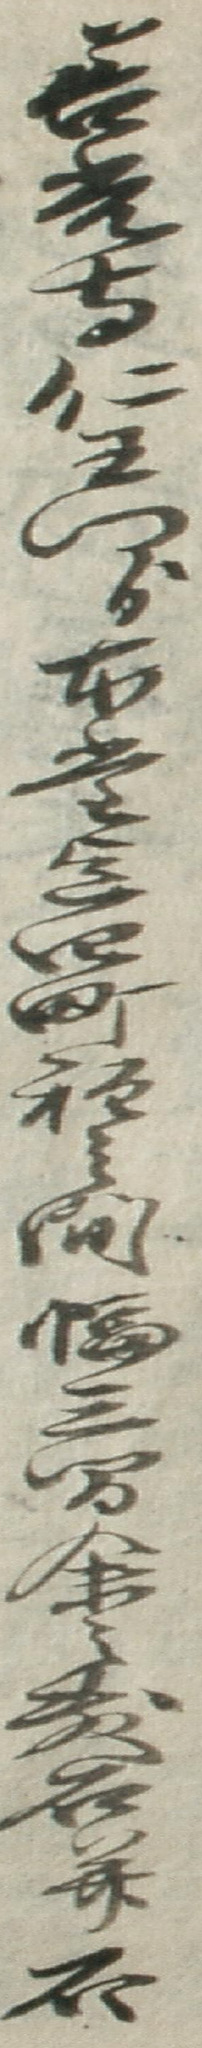善光寺仁王門ゟ本堂迄四町程之間巾三間余之敷石并石
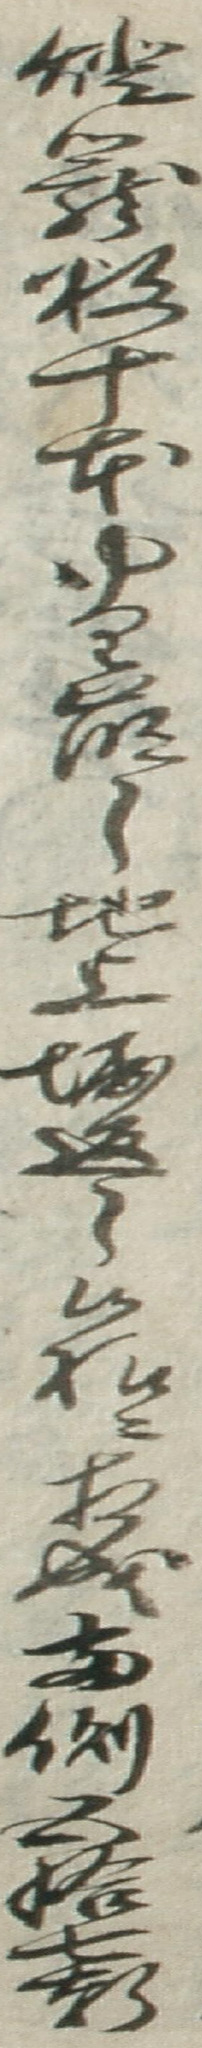燈籠数十本ゆり崩し地上堀返し候様二相成両側五拾七軒
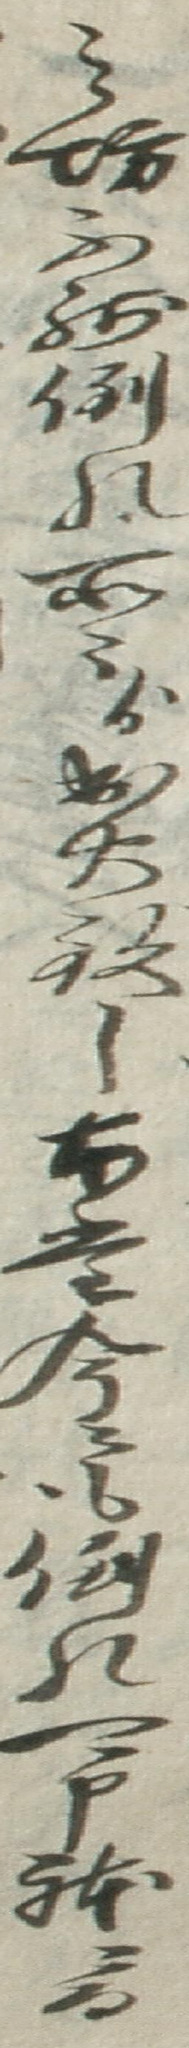之坊不残倒れ所々ゟ出火致し本堂今二も倒れ可申躰二而
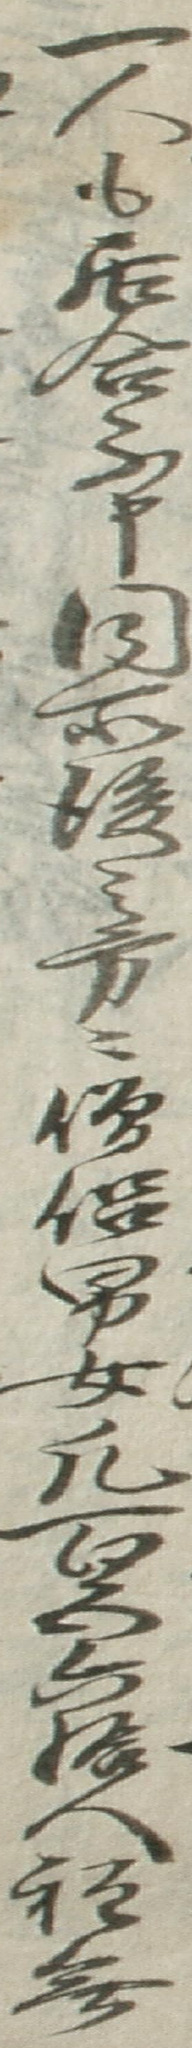一人も居合不申同所後之方二僧侶男女凡百五六拾人程無
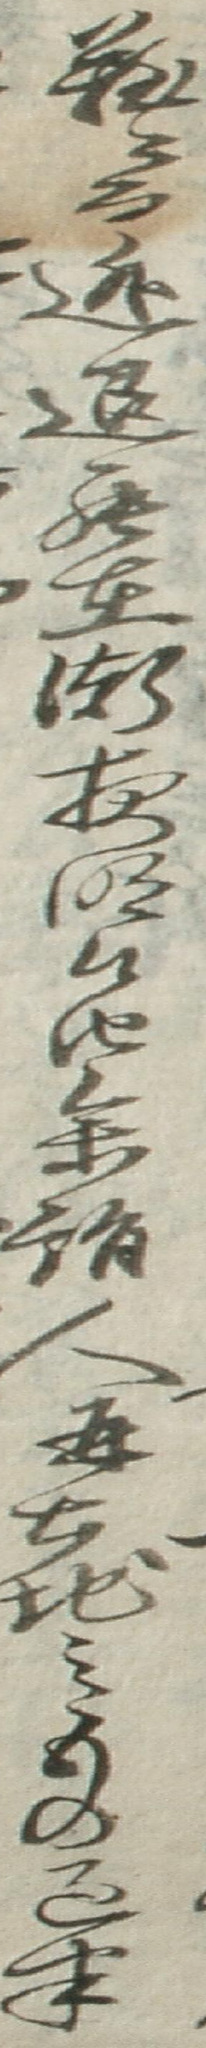難二而逃退罷在漸夜明候由参詣人并土地之もの過半
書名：信濃國地震實録記
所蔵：東京大学地震研究所図書室 Earthquake Research Institute Library, The University of Tokyo, JAPAN
